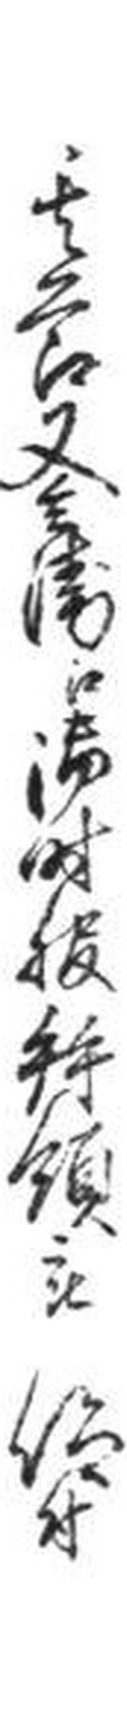其節又兵衛江御時服拝領被仰付
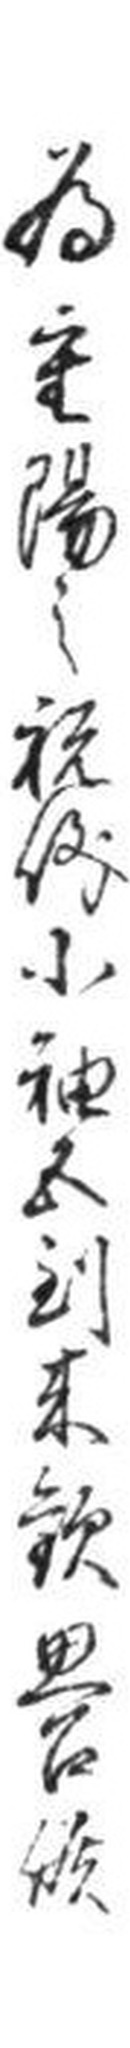為重陽之祝儀小袖五到来歓思召候
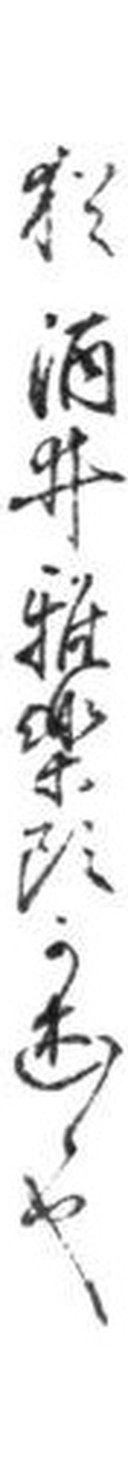猶酒井雅楽頭可述候也
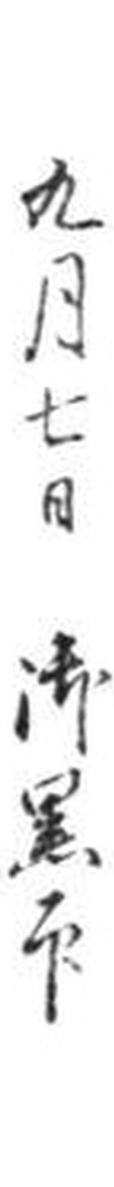九月七日御黒印
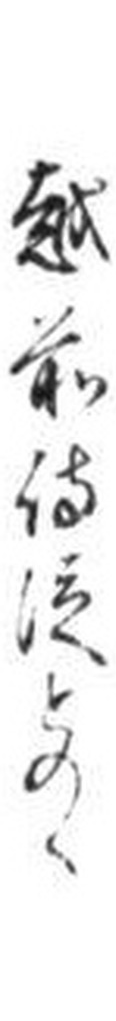越前侍従とのへ
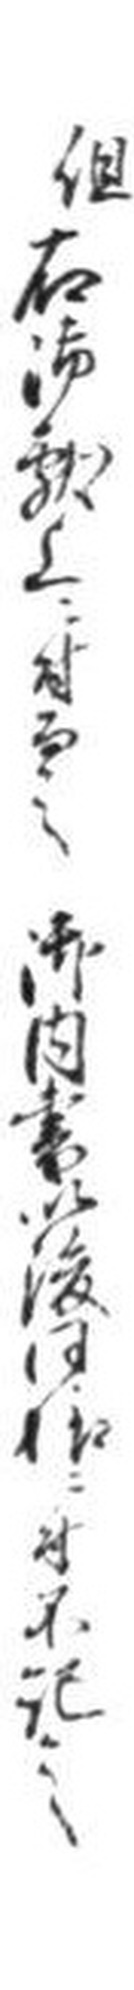但右御献上ニ付而之御内書以後同様ニ付不記之
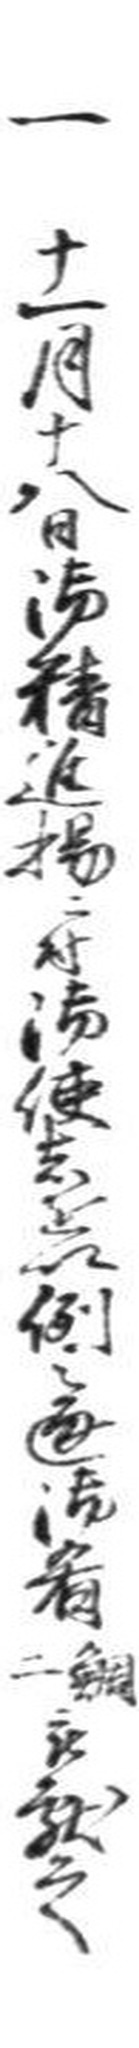一十一月十八日御精進揚ニ付御使者を以例之通御肴鯛ニ被献之
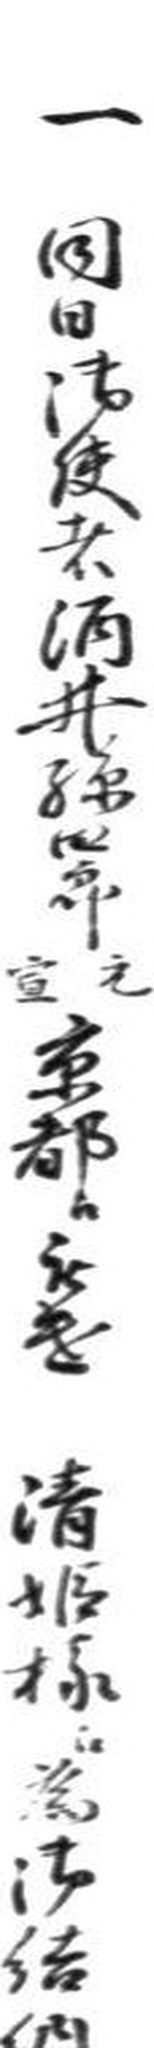一同日御使者酒井孫四郎元宣京都江被遣清姫様江為御結納

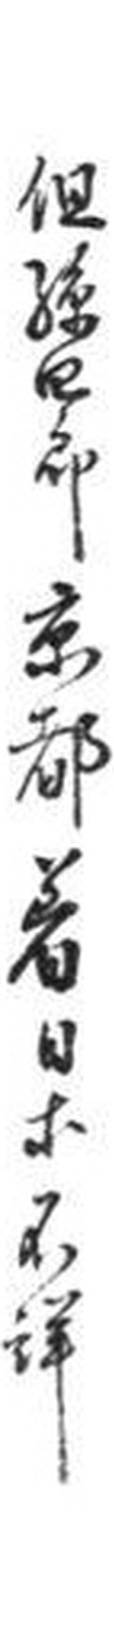但孫四郎京都着日等不詳
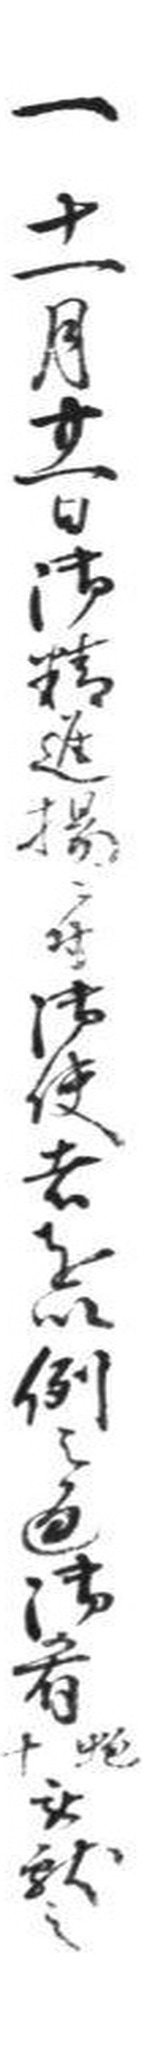一十一月廿一日御精進揚ニ付御使者を以例之通御肴蚫十被献之
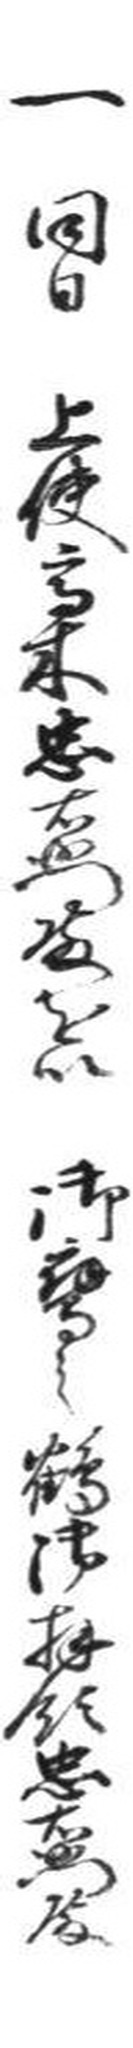一同日上使高木忠右衛門殿を以御鷹之鶴御拝領忠右衛門殿
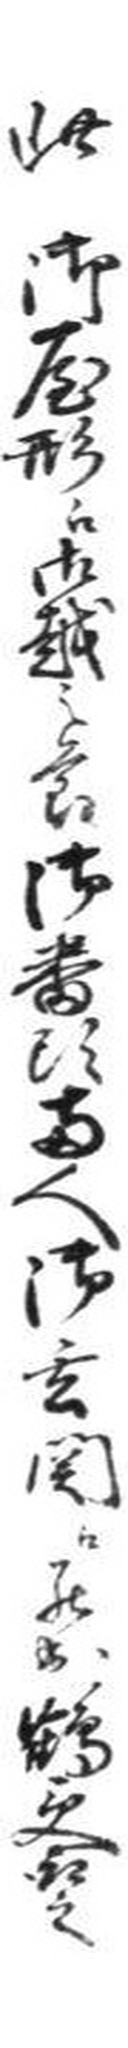此御屋形江御越之節御番頭両人御玄関江罷出鶴受取之
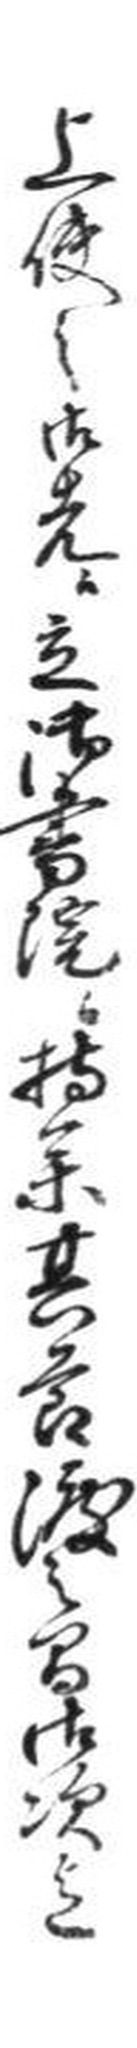上使之御先江立御書院江持参其節渡之間御次迄
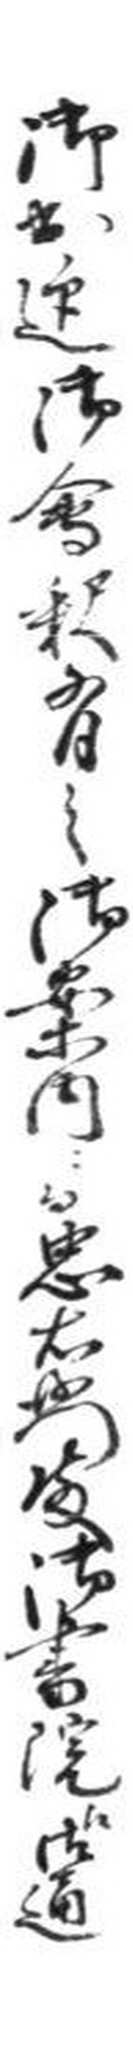御出迎御会釈有之御案内ニ而忠右衛門殿御書院江御通
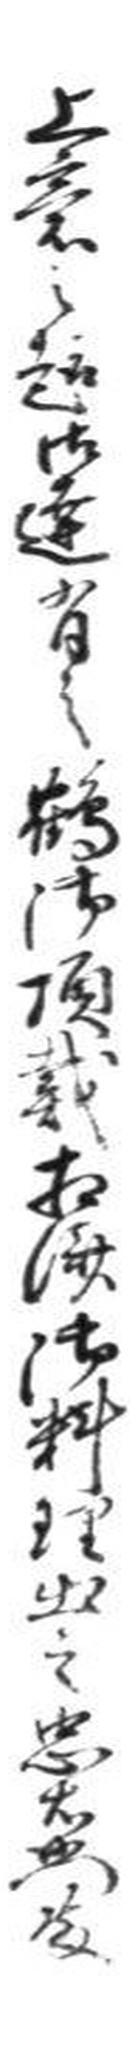上意之趣御達有之鶴御頂戴相済御料理出之忠右衛門殿
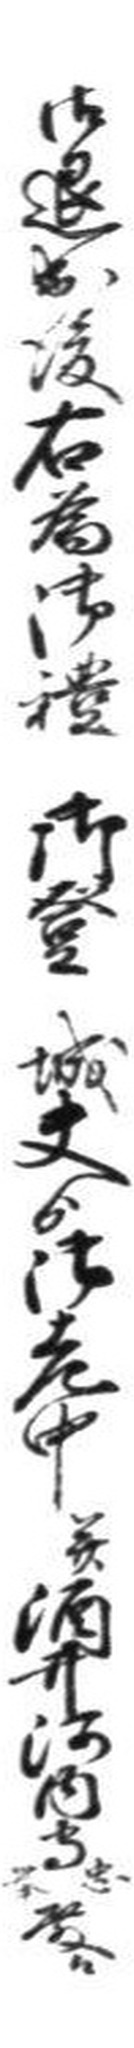御退出後右為御礼御登城夫ゟ御老中并酒井河内守忠挙殿江
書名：家譜 十三 綱昌公 従寛文元年到延宝五年
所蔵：福井県文書館 Fukui Prefectural Archives
